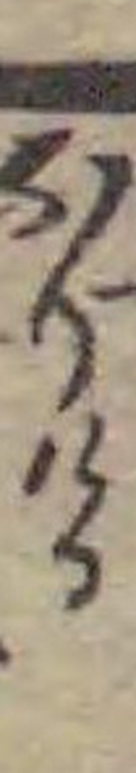なりける
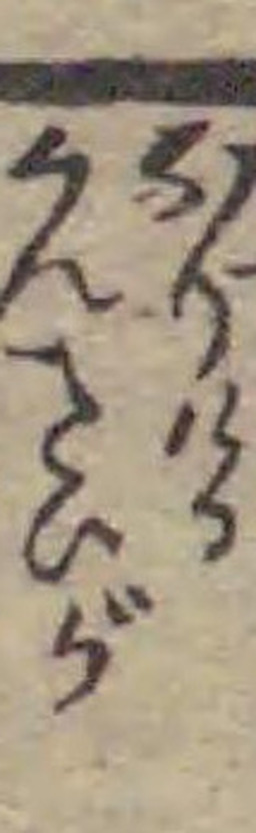くんさいが
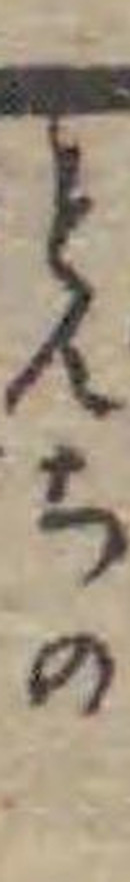とんちの
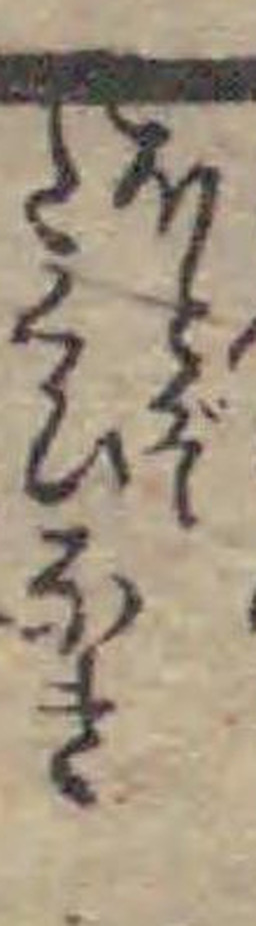たくひなき
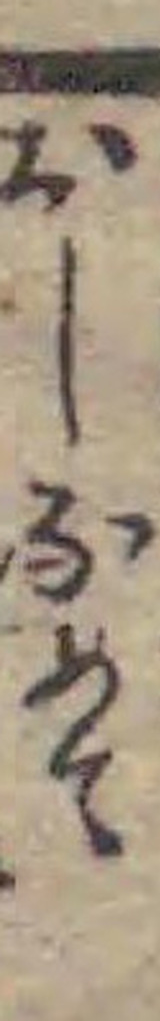おしなめて
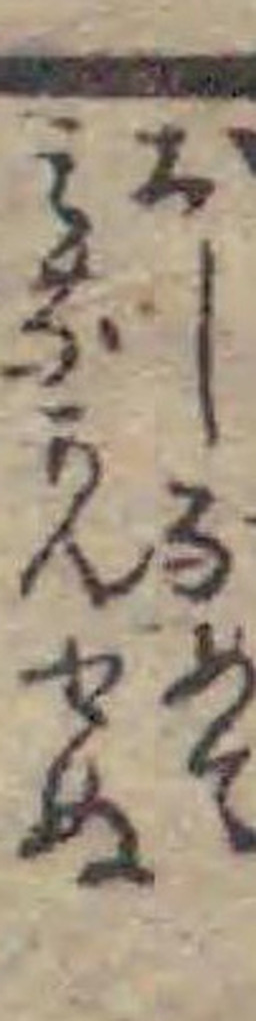みなかんせぬ
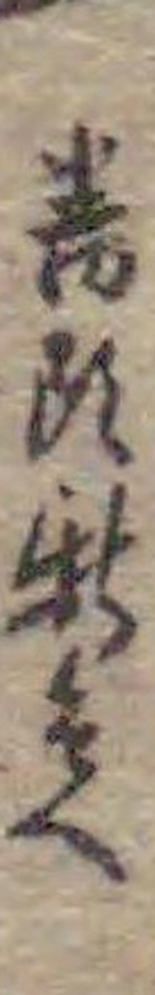番頭新兵へ
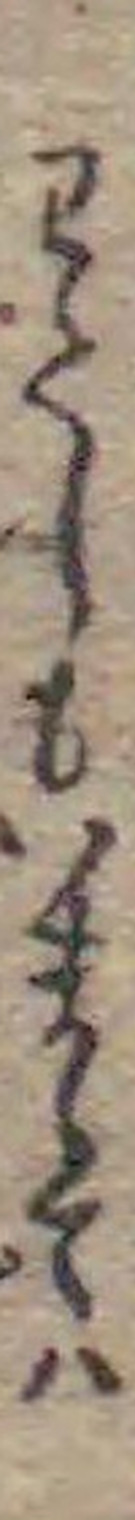わたしもいまゝては
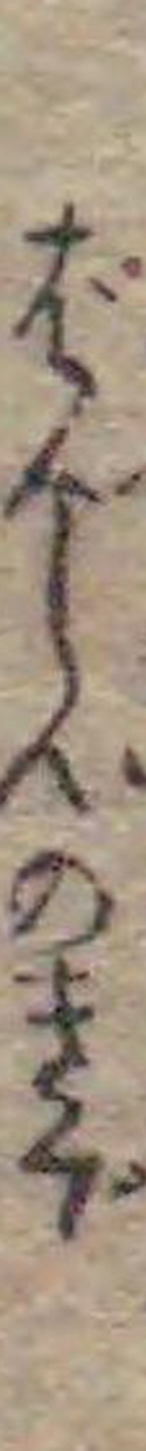ばんしんのきで
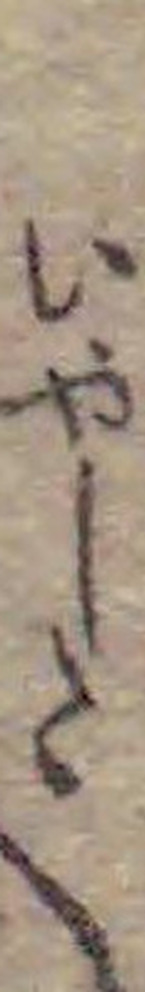いやした
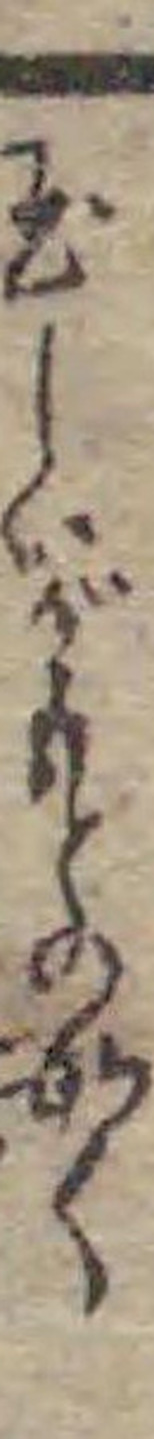玉しいがもとの如く
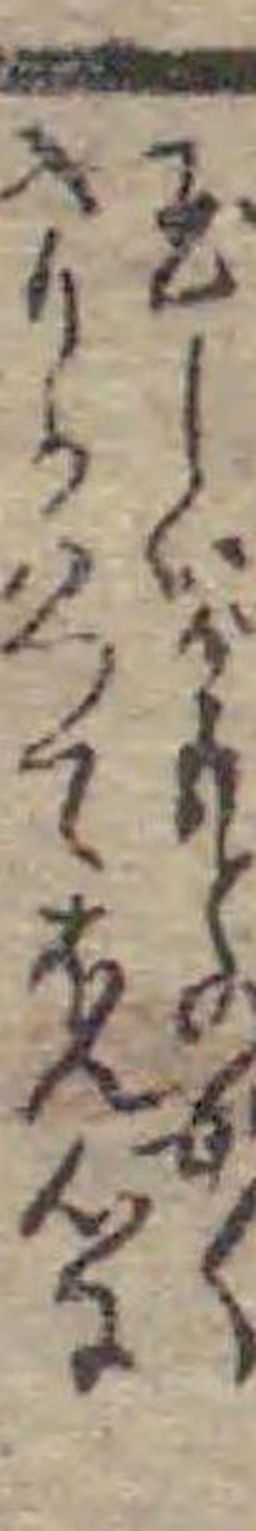入りかはつてほん心に
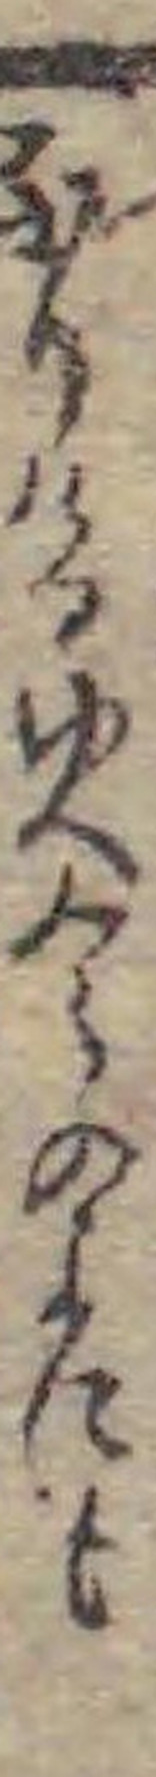なりけるゆへ今のよにも
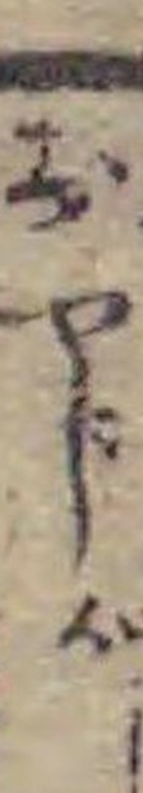おやじが
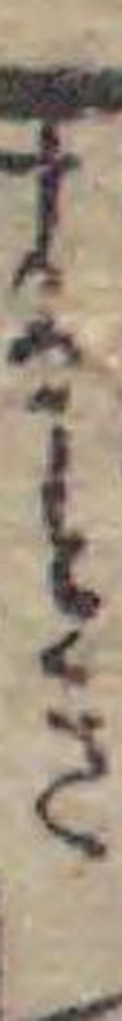するとき
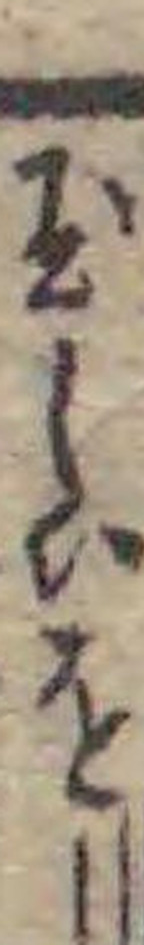玉しいを
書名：江戸花俳優贔屓 : 3巻
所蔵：国立国会図書館 National Diet Library, JAPAN
